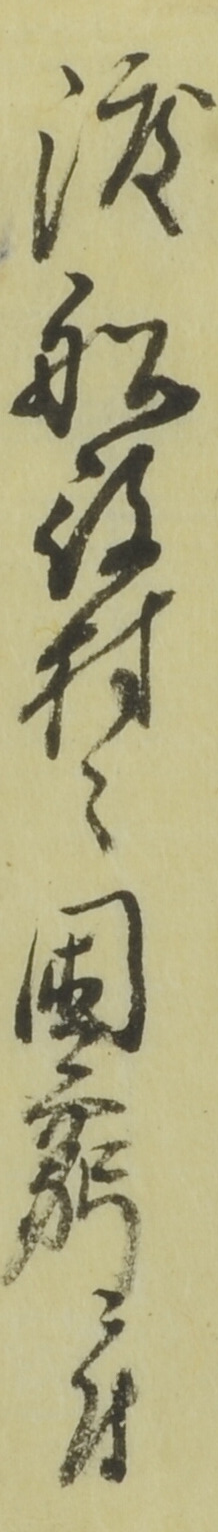渡船役村々困窮ニ付
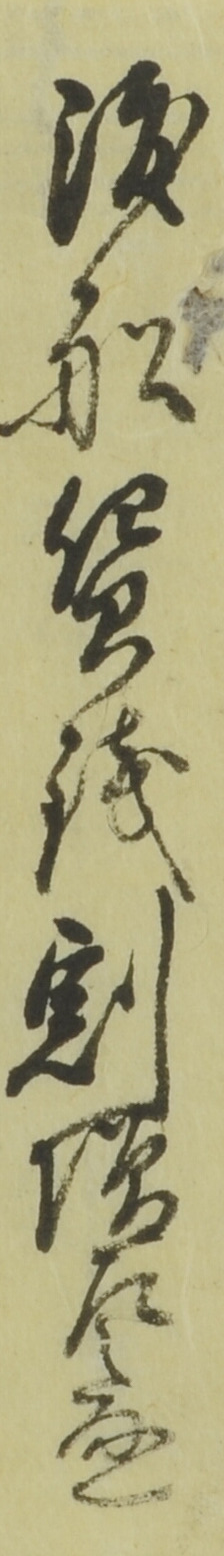渡船賃銭割増左之通
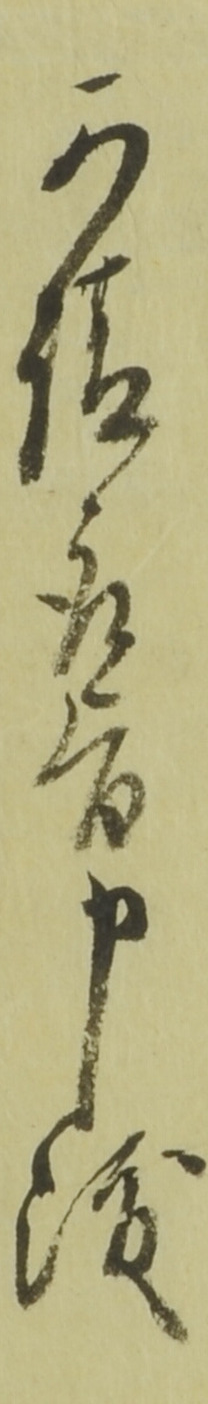可請取旨申渡
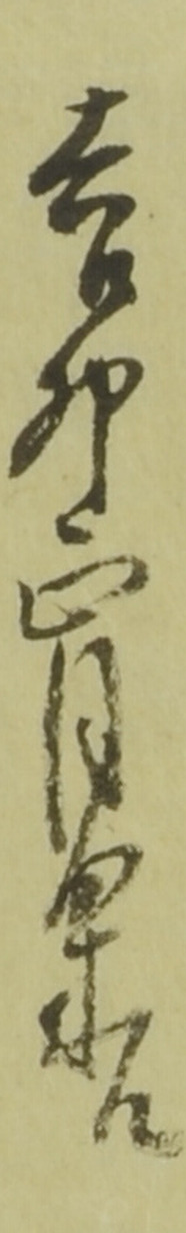去ル卯正月ゟ来ル
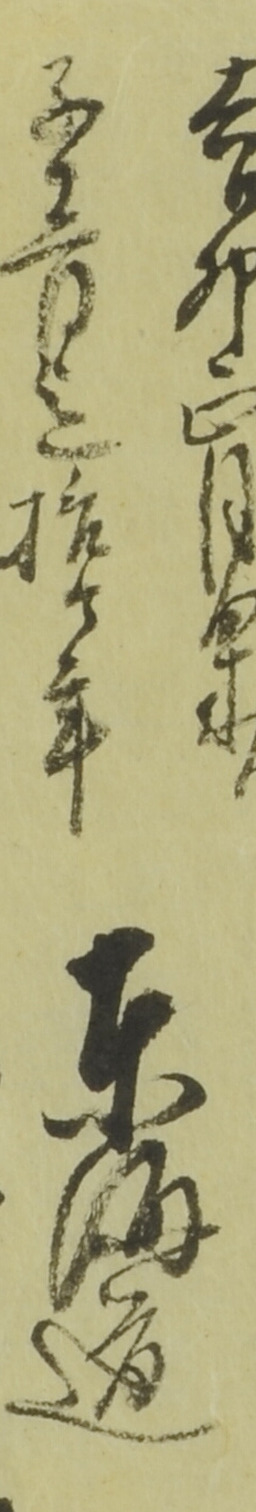子十二月迄拾ヶ年東海道
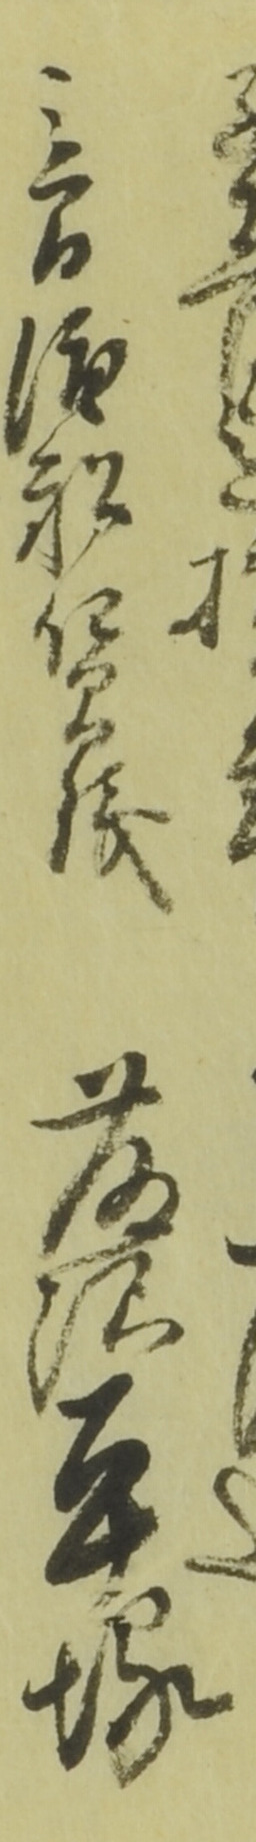之間渡船賃銭藤沢平塚
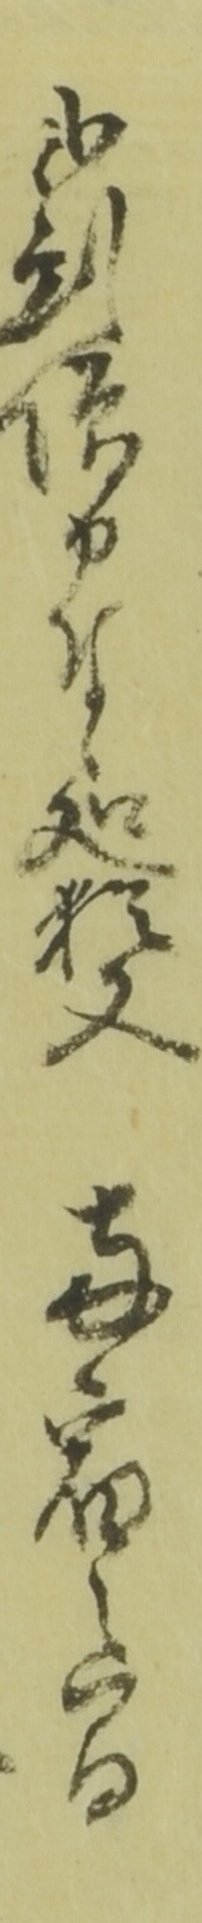弐割増申付候処猶又両宿之間
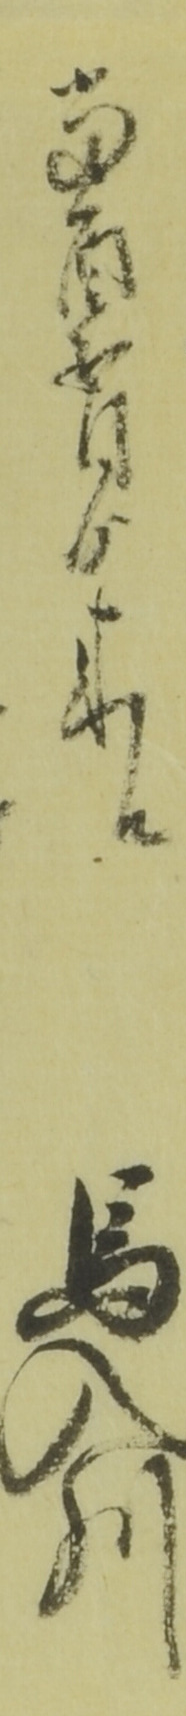当酉五月ゟ来ル馬入川
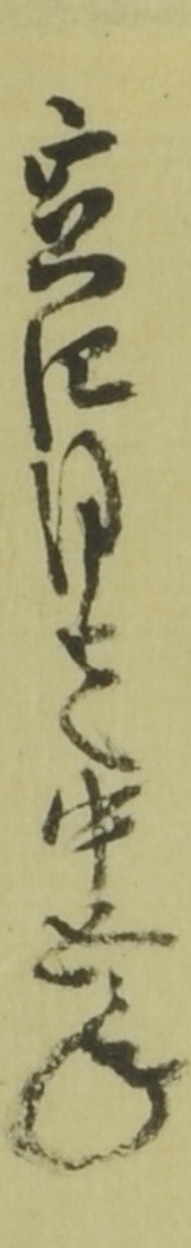寅四月迄中五年
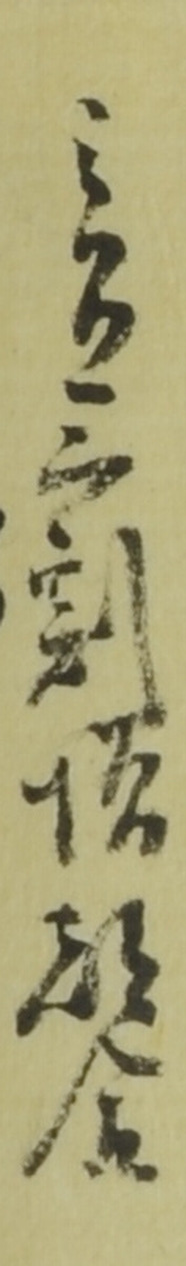之間三割増都合
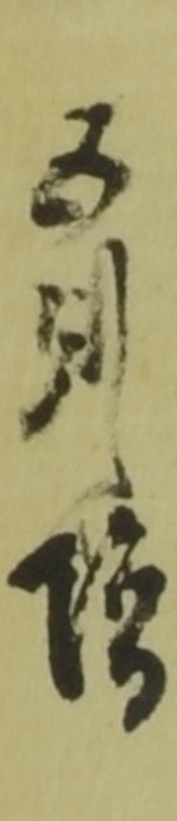五割増
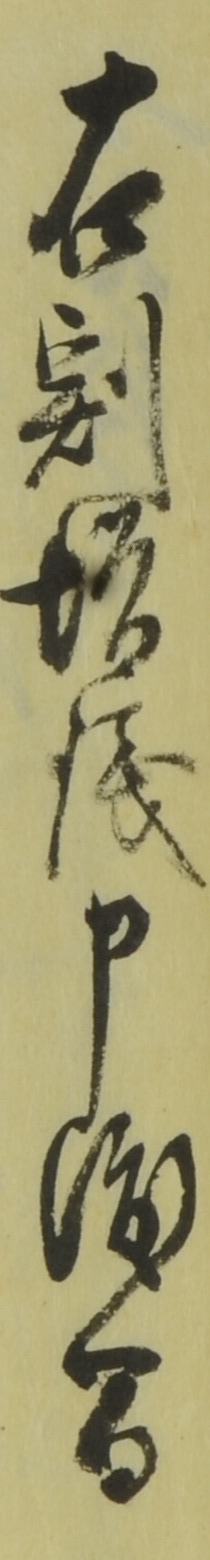右割増銭申渡間

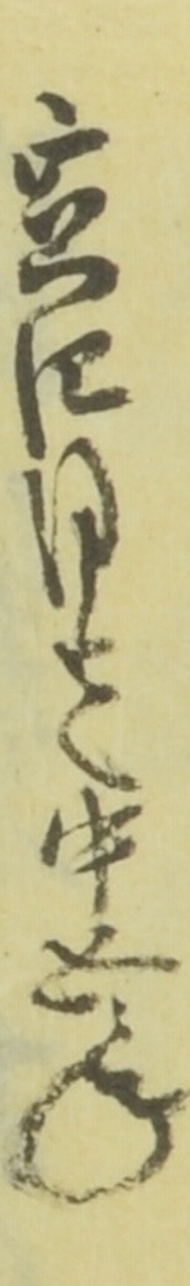寅四月迄中五年
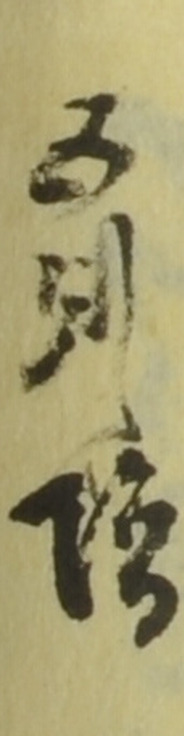五割増
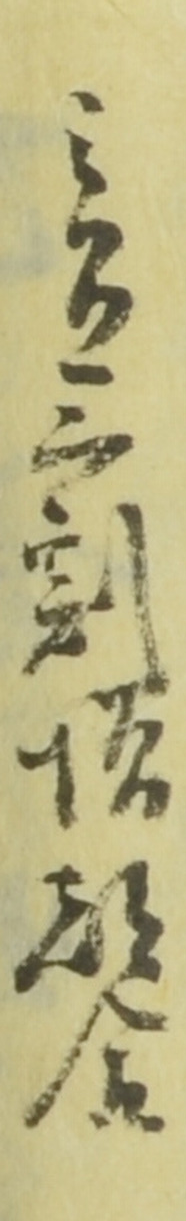之間三割増都合
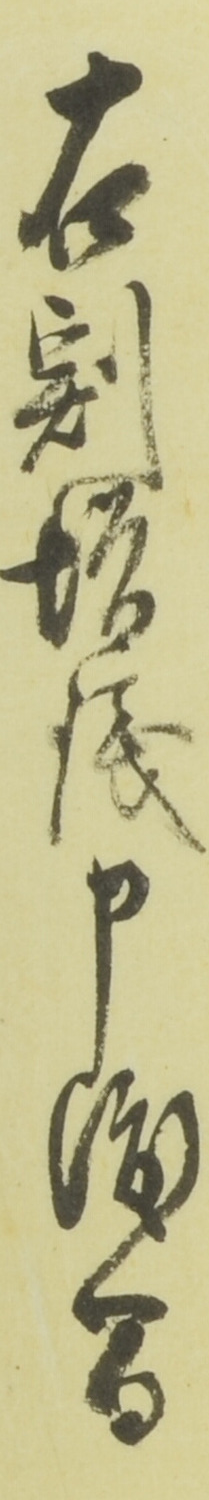右割増銭申渡間
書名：御触書御書附控
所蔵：伊那市立高遠町図書館・合同会社AMANE
